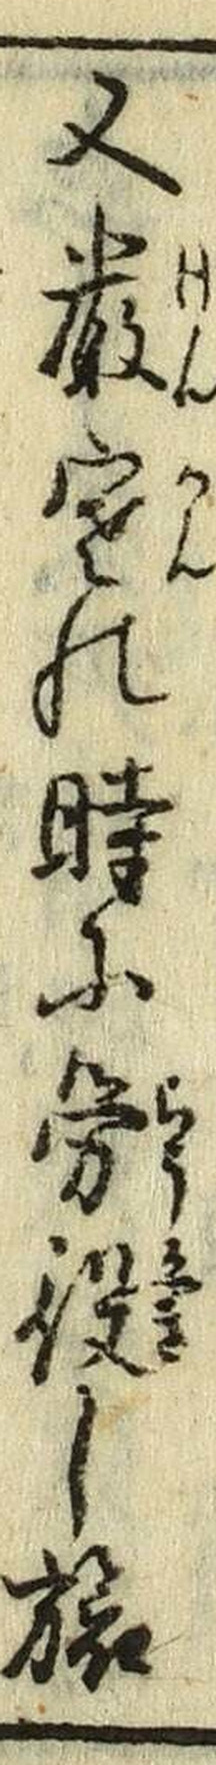又厳寒の時に労役し旅
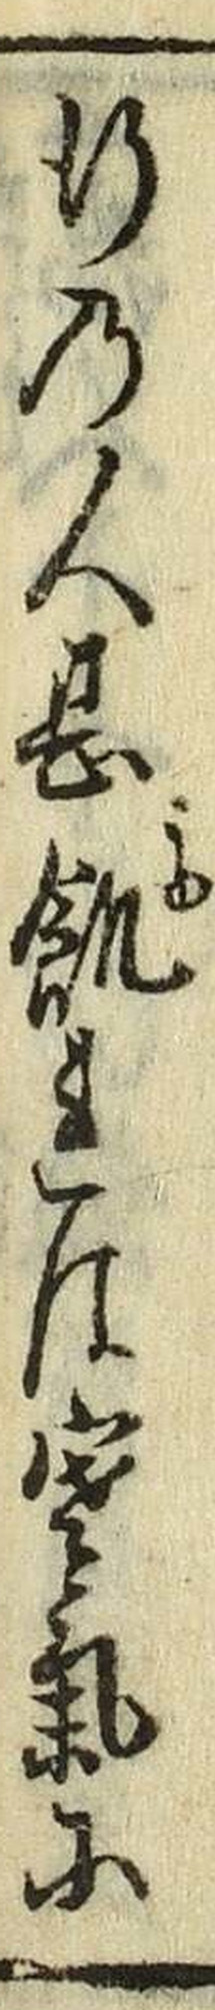行の人甚飢れは寒気に
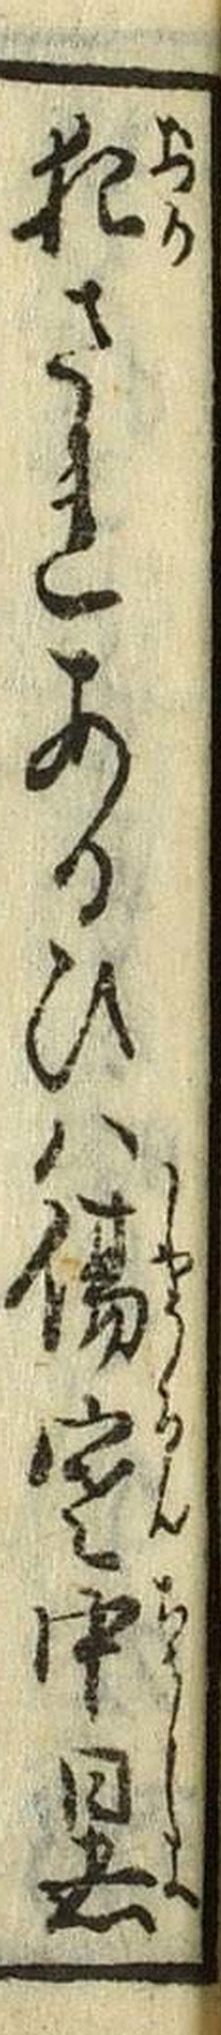犯されあるひは傷寒中暑
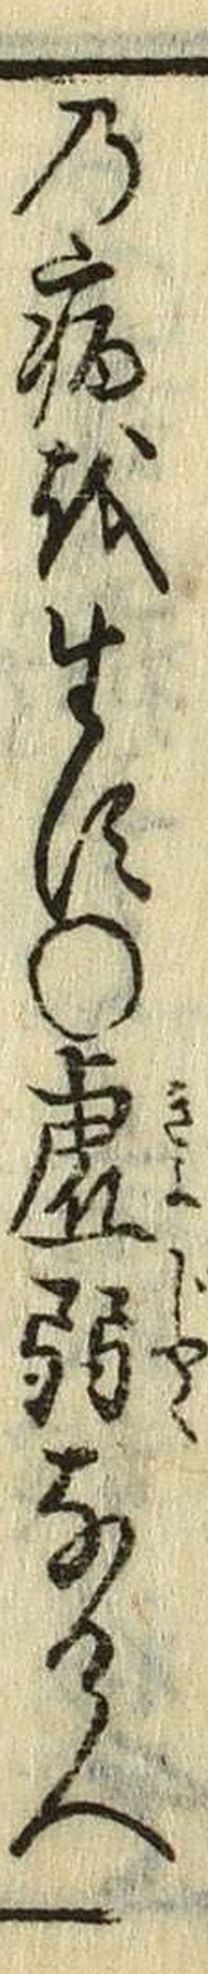の病を生す○虚弱なる人
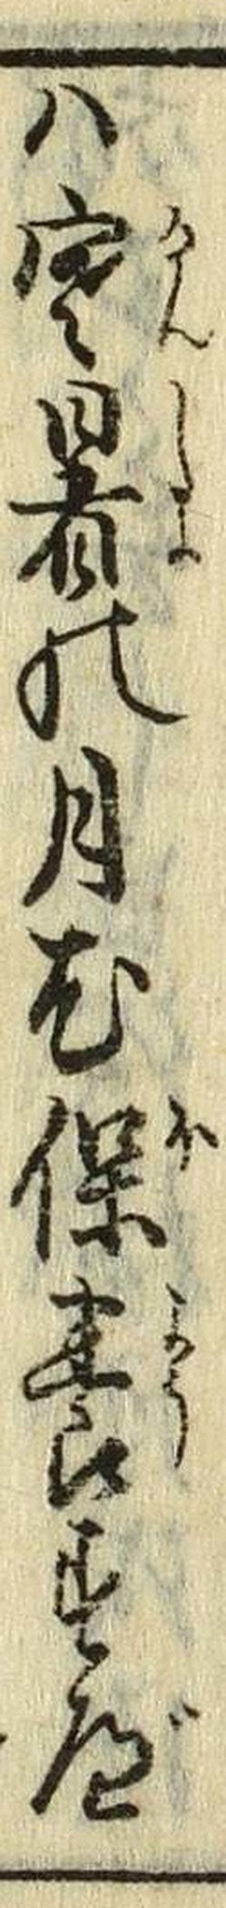は寒暑の月尤保養すべ
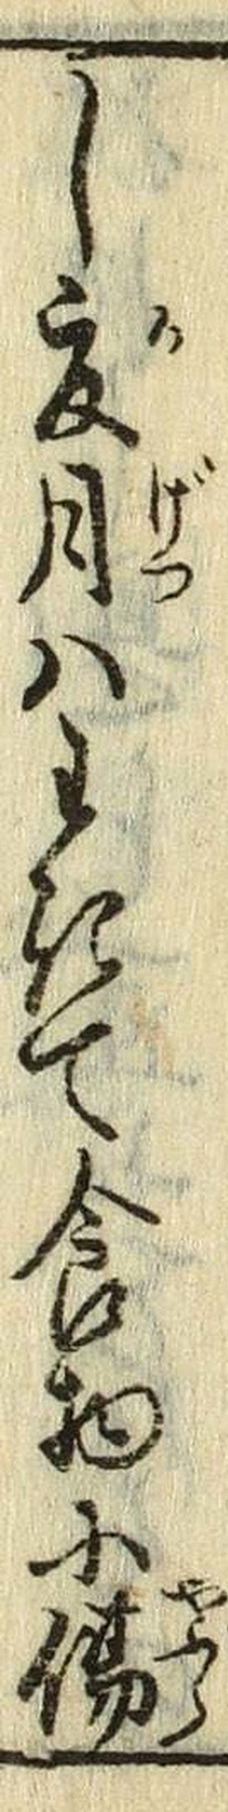し夏月はわきて食物に傷
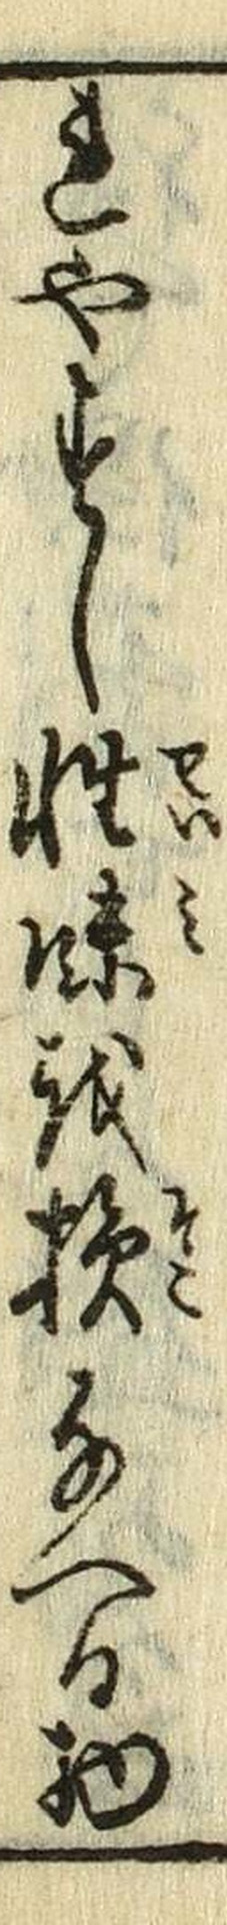れやすし性味を損なへる物
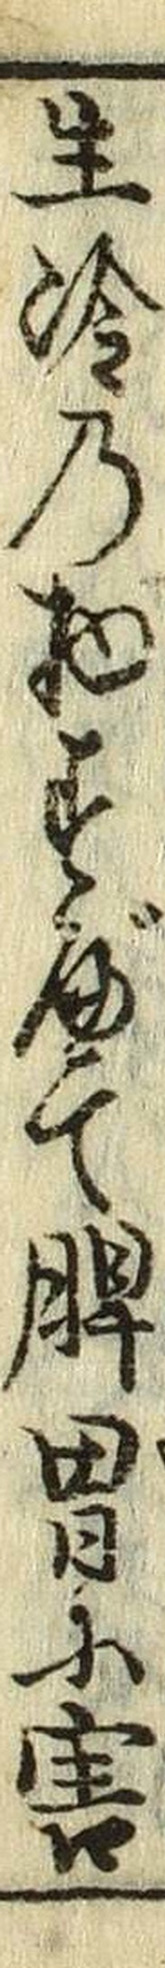生冷の物すべて脾胃に害
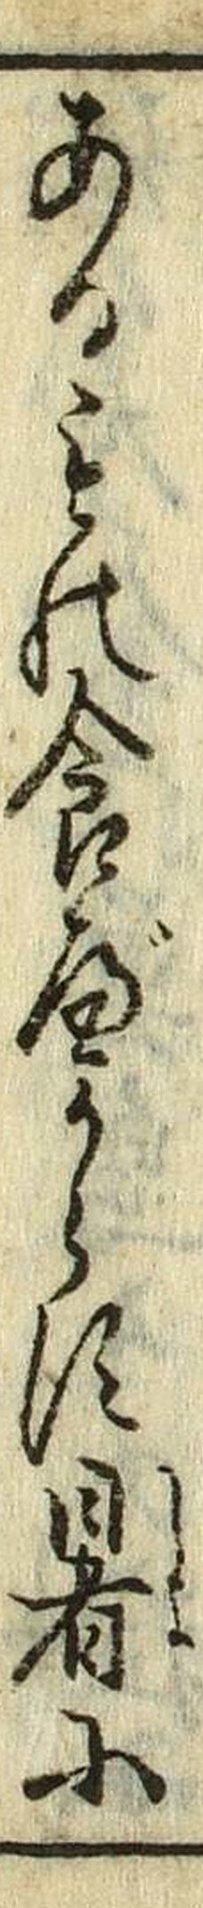あるもの食べからす暑に
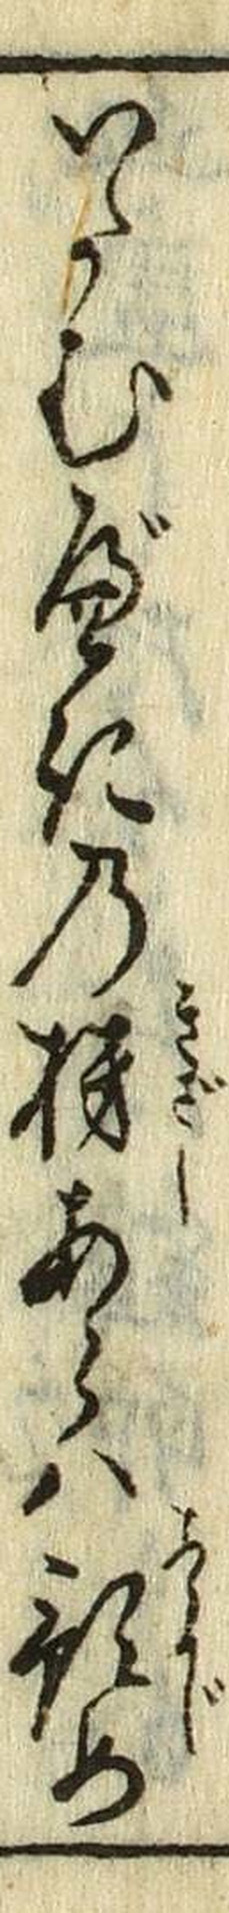いたむべきの機あらは預め
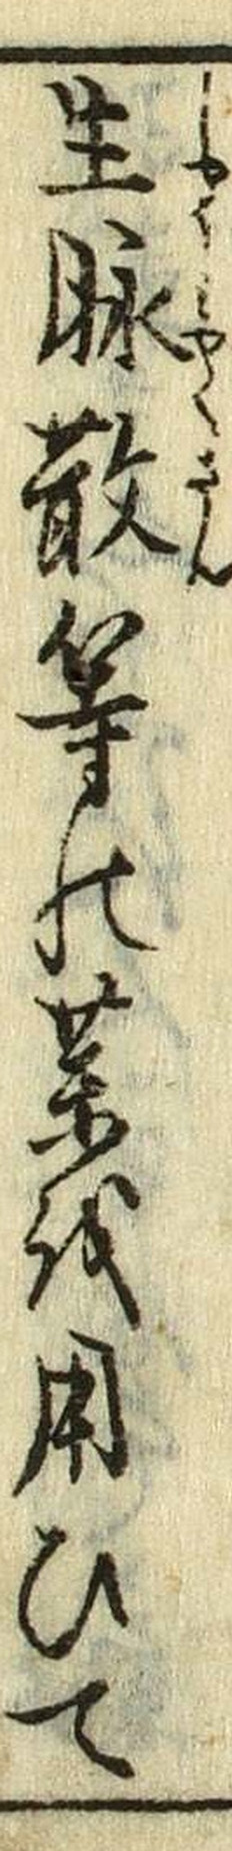生脈散等の薬を用ひて
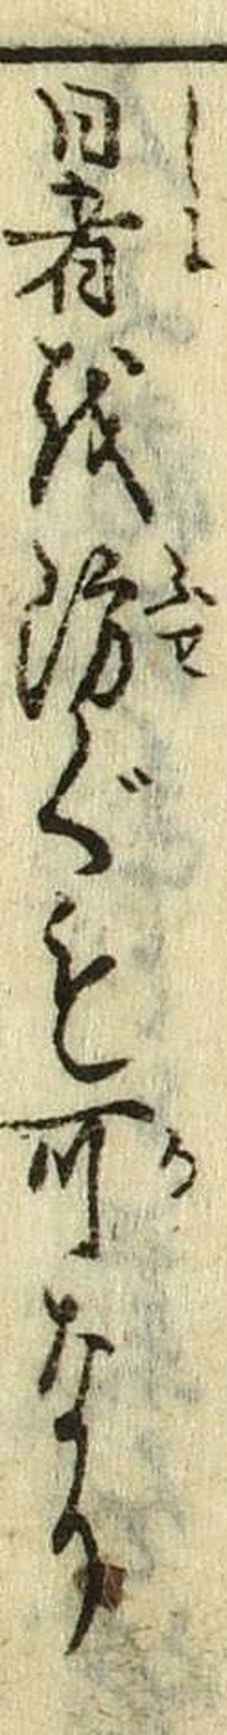暑を防ぐも可なり
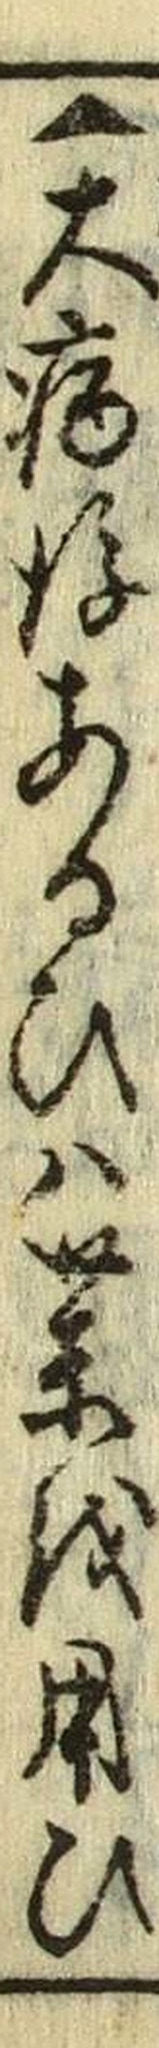▲大病後あるひは薬を用ひ

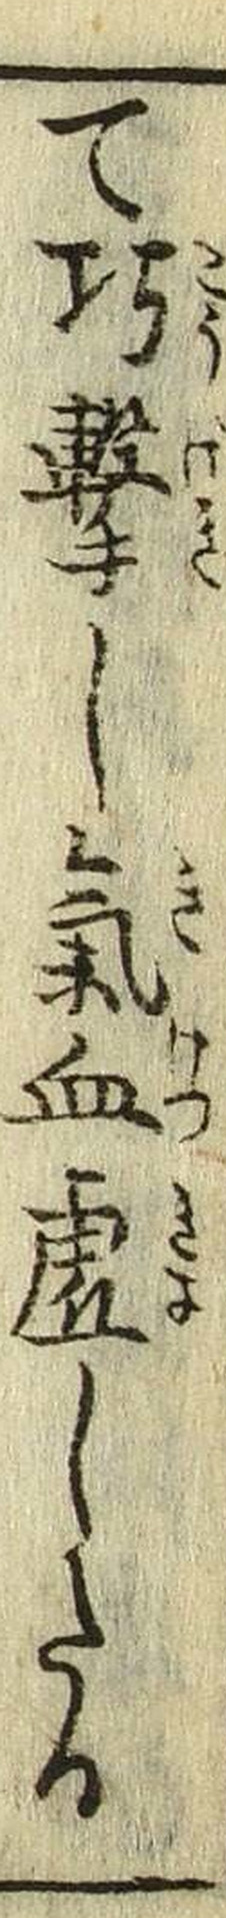て攻撃し気血虚したる
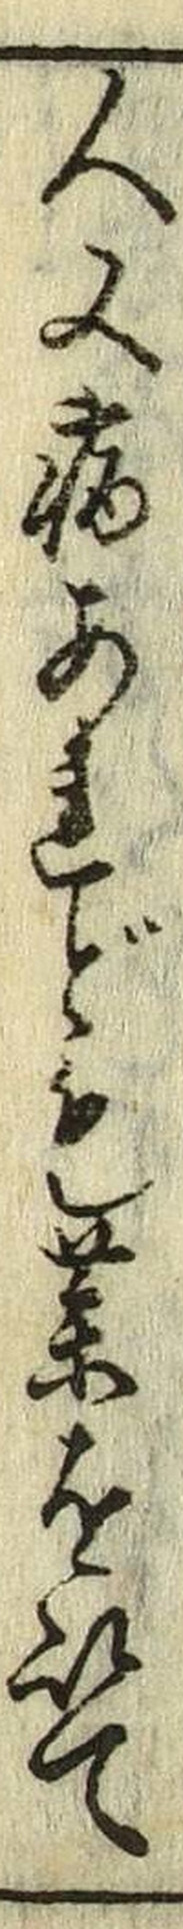人又病あれども薬を以て
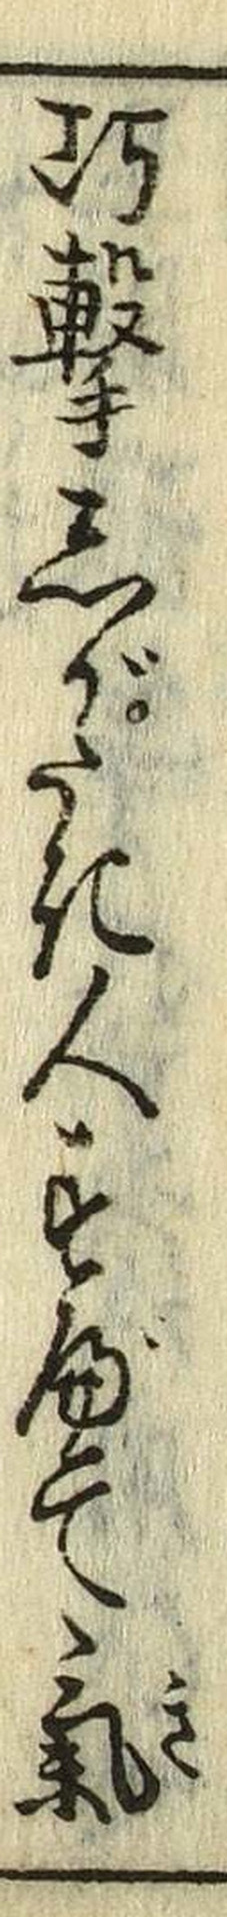攻撃しがたき人すべて気
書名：居家養生記
